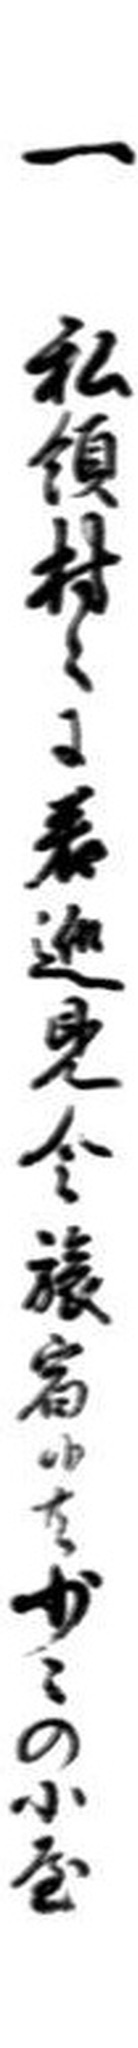一私領村々に若巡見令旅宿候共少々の小屋

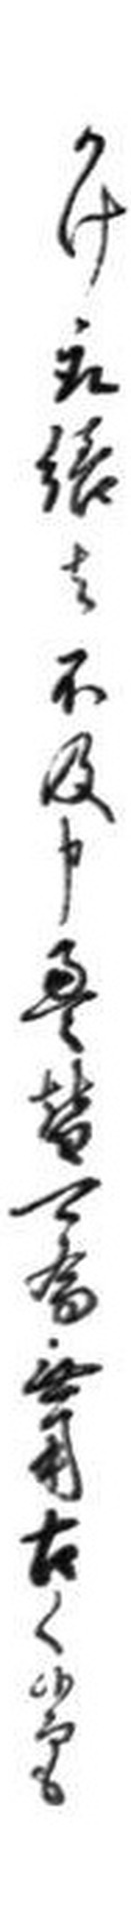かけ取繕者不及申畳替可為無用古く候而も
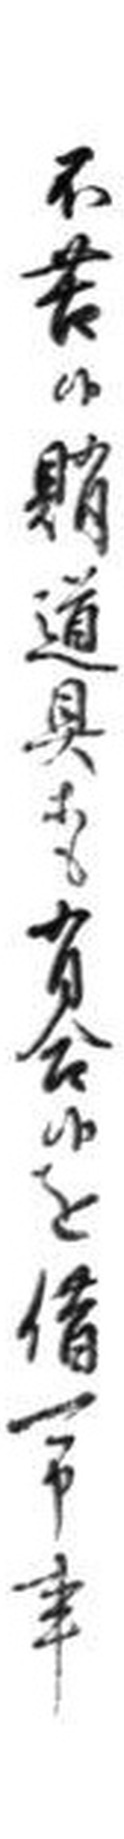不苦候賄道具等も有合候を借可申事
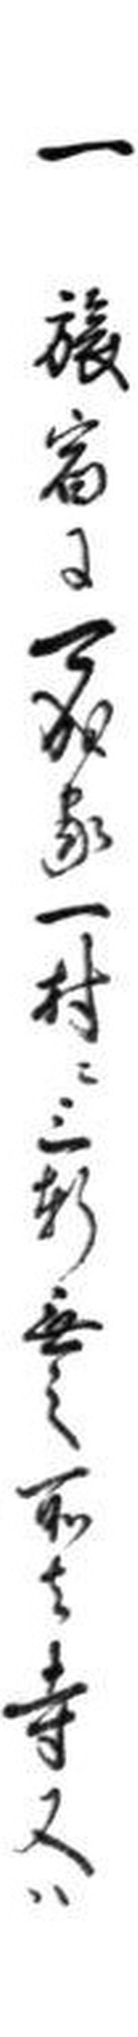一旅宿に可成家一村ニ三軒無之所者寺又ハ
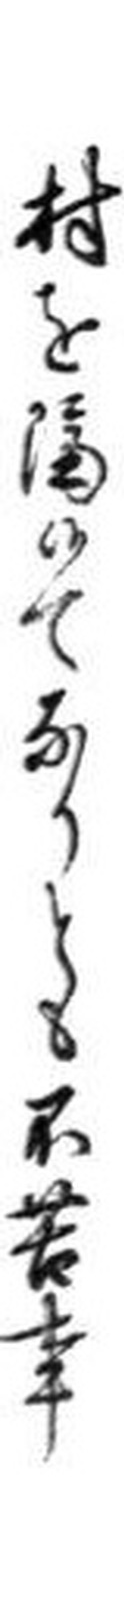村を隔候てなりとも不苦事
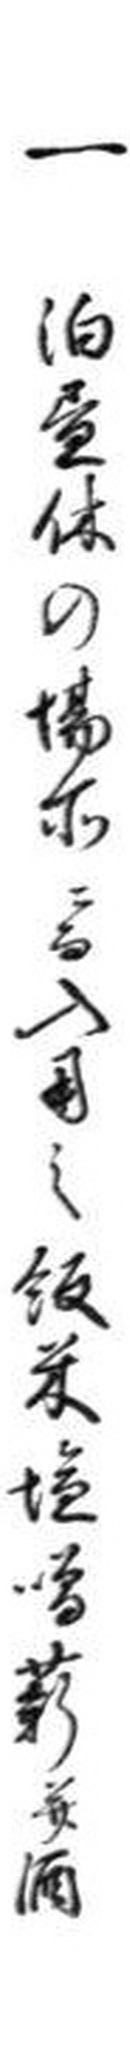一泊昼休の場所ニ而入用之飯米塩噌薪并酒
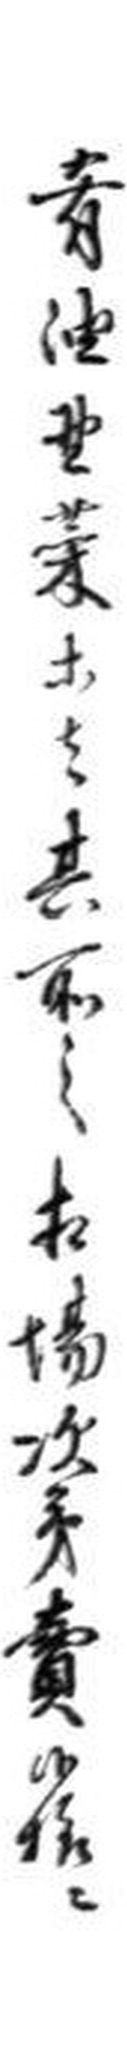肴油野菜等者其所之相場次第売候様ニ
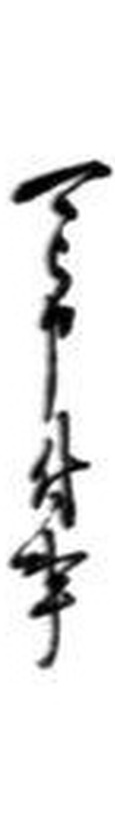可被申付事
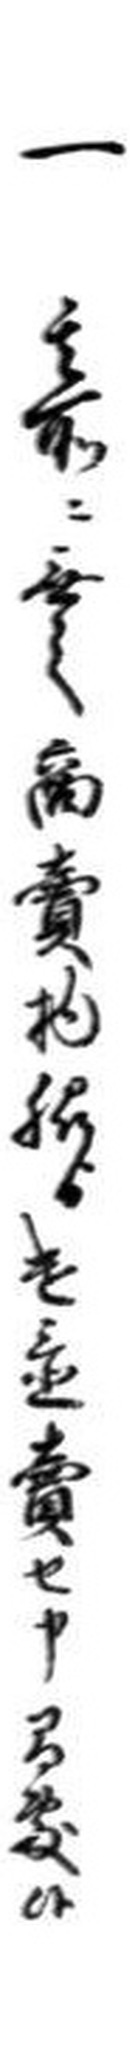一其所ニ無之商売物脇ゟ遣置売セ申間敷候
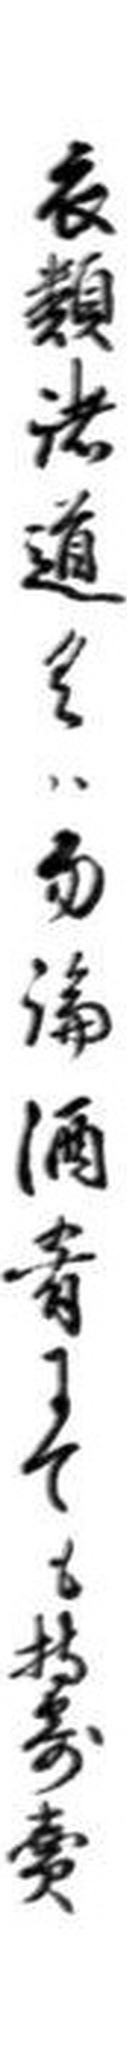衣類諸道具ハ勿論酒肴にても持寄売
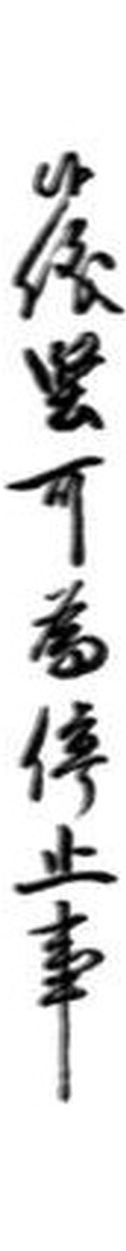候儀堅可為停止事
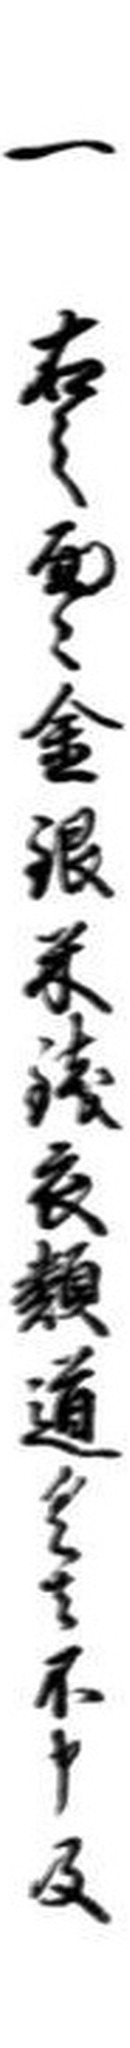一右之面々金銀米銭衣類道具者不申及
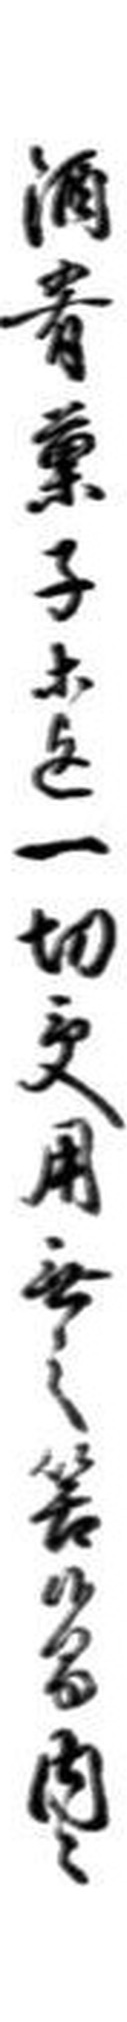酒肴菓子等迄一切受用無之筈候間内々
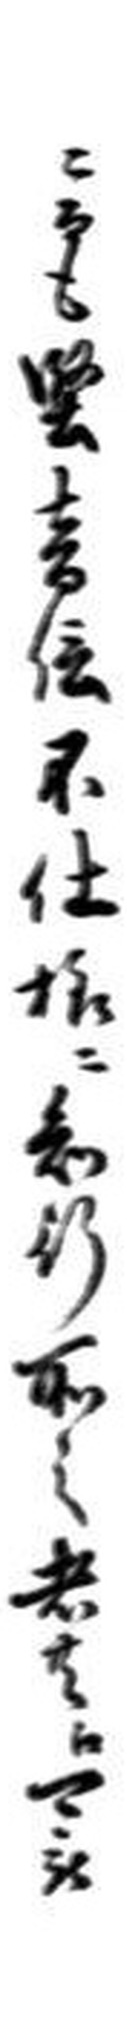ニ而も堅音信不仕様ニ知行所之者共江可被
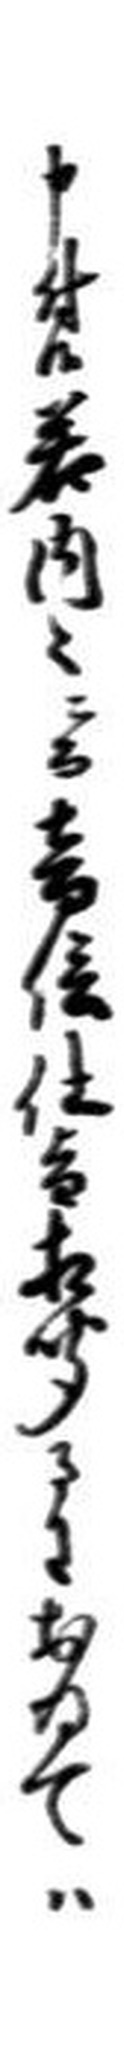申付候若内々ニ而音信仕旨相聞るにおゐてハ
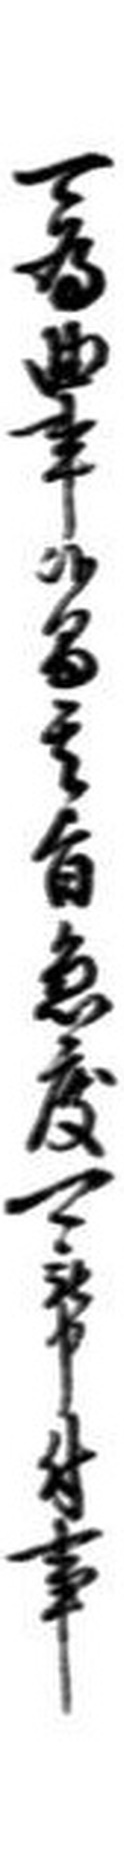可為曲事候間其旨急度可被申付事
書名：家譜 三十一 吉邦公 享保元年
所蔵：福井県文書館 Fukui Prefectural Archives
